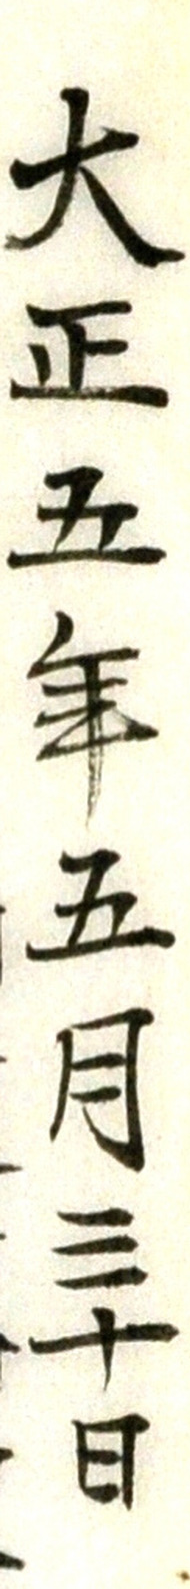大正五年五月三十日
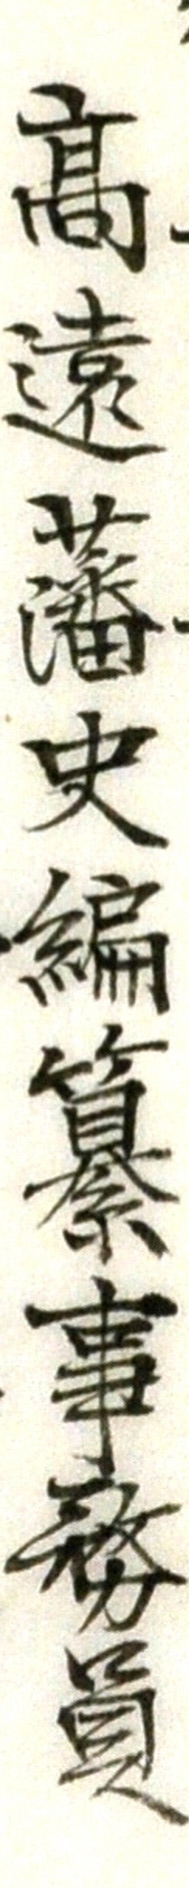高遠藩史編纂事務員
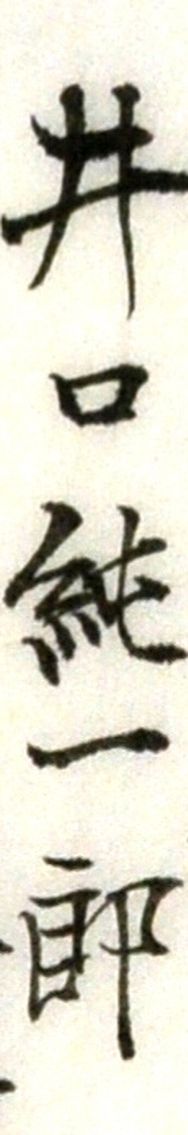井口純一郎

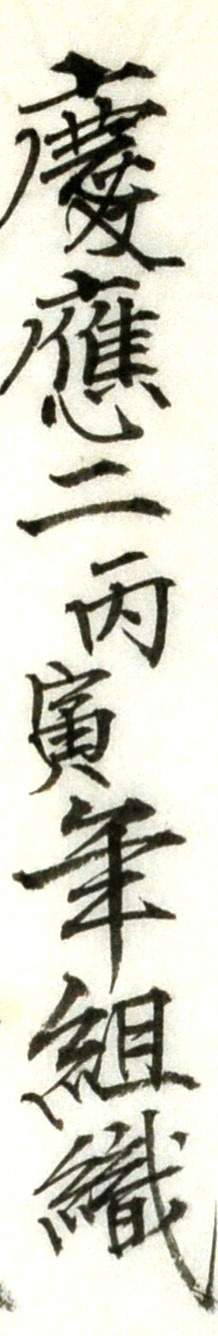慶応二丙寅年組織

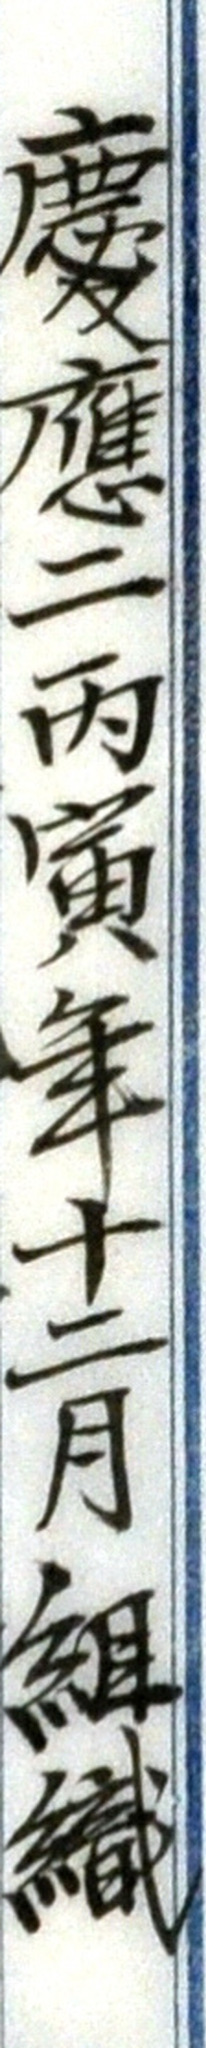慶応二丙寅年十二月組織
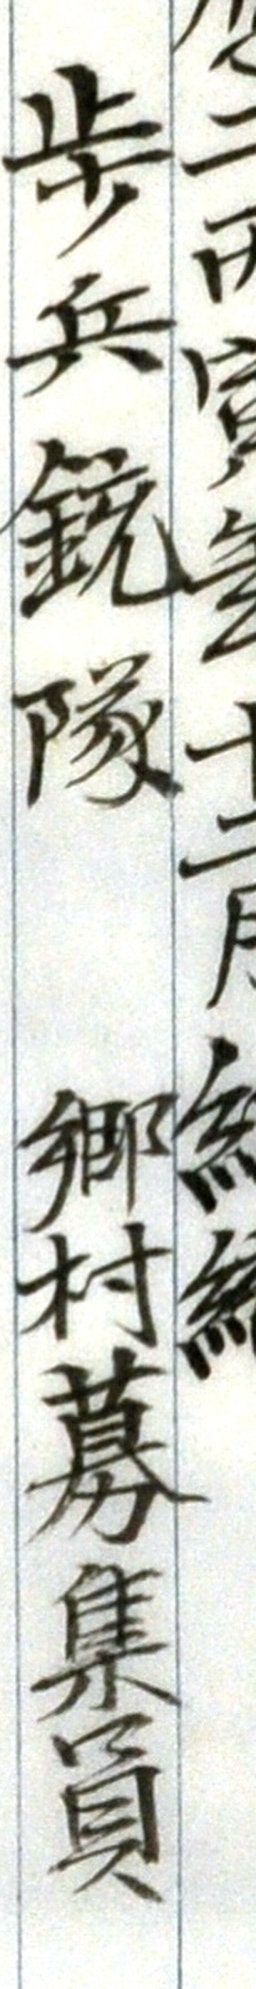歩兵銃隊郷村募集員
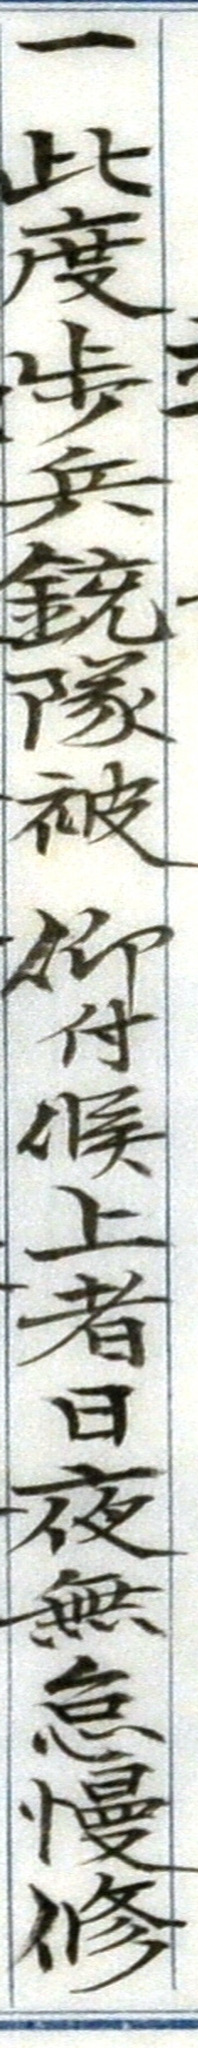一此度歩兵銃隊被仰付候上者日夜無怠慢修
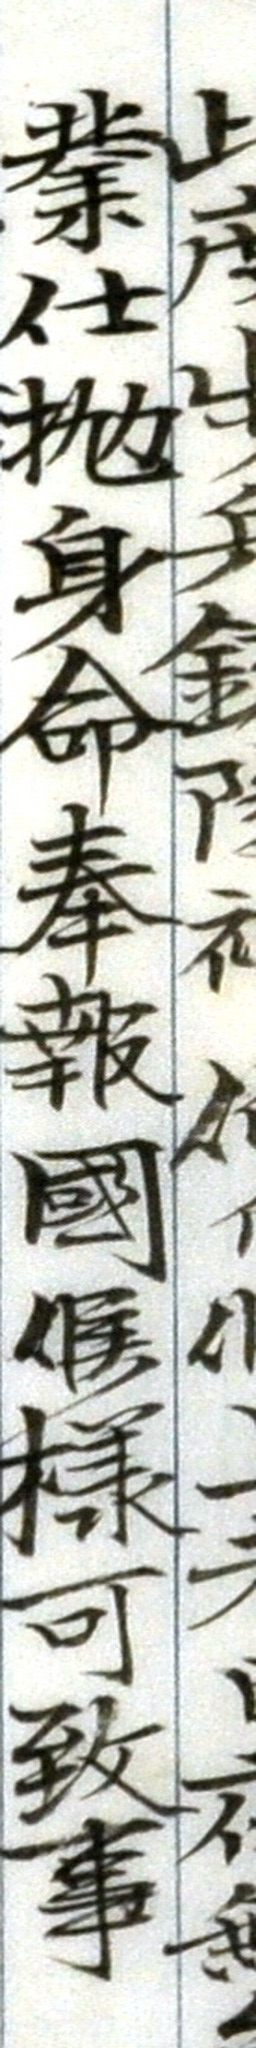業仕抛身命奉報国候様可致事
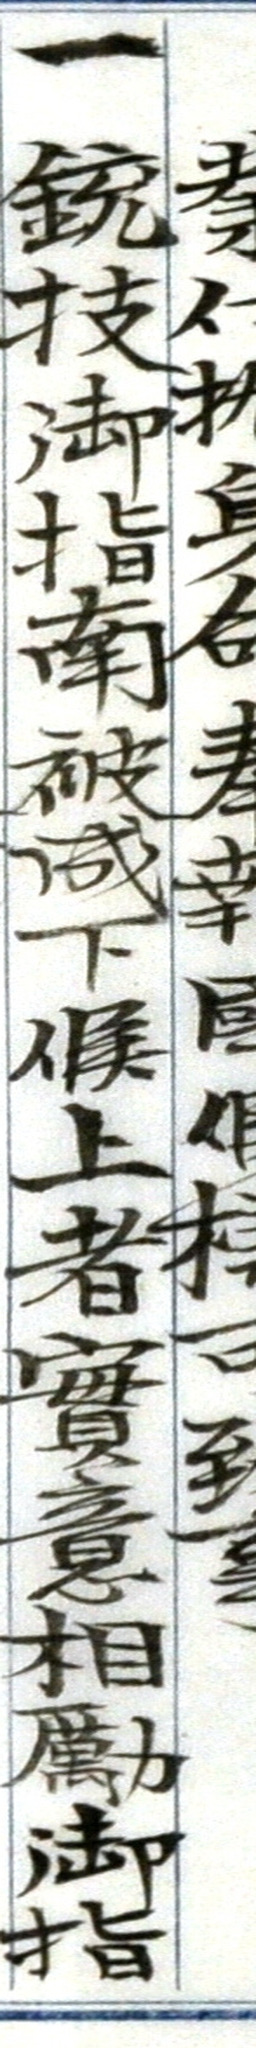一銃技御指南被成下候上者実意相励御指
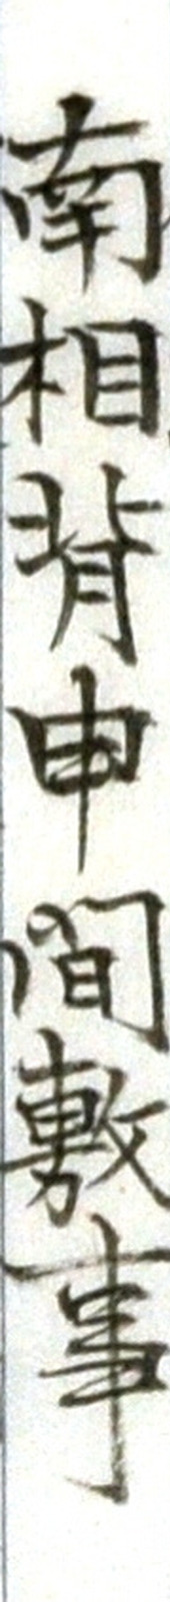南相背申間敷事
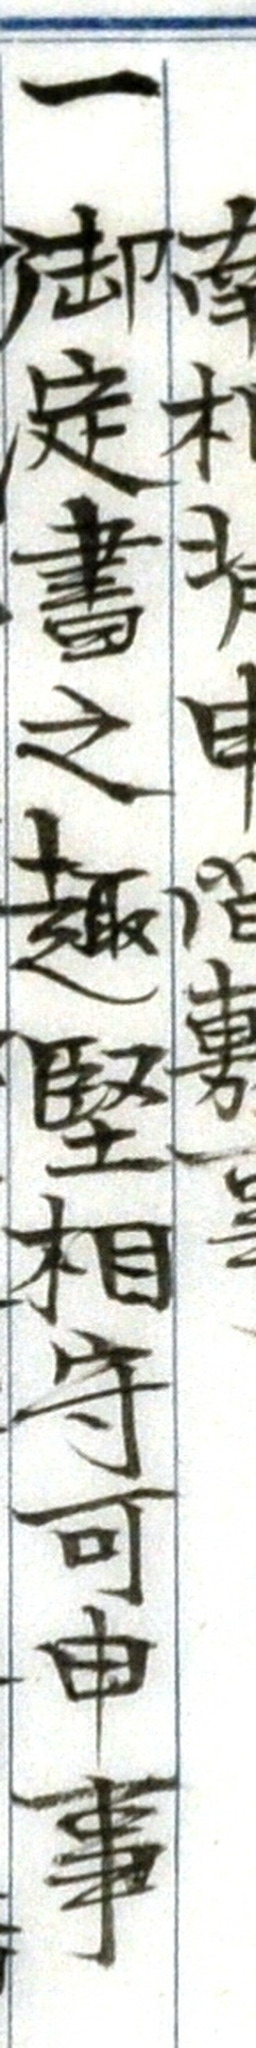一御定書之趣堅相守可申事
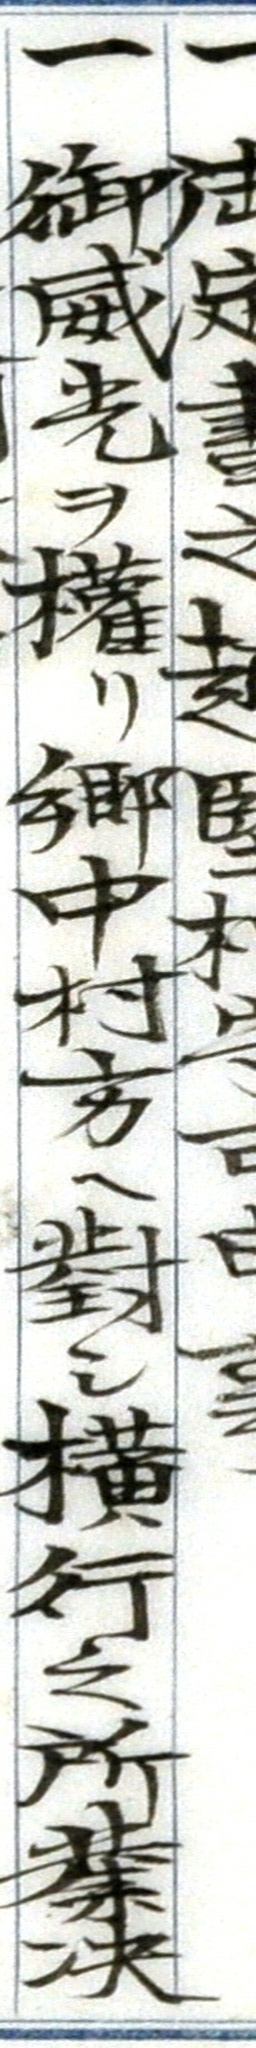一御威光ヲ権リ郷中村方ヘ対シ横行之所業決
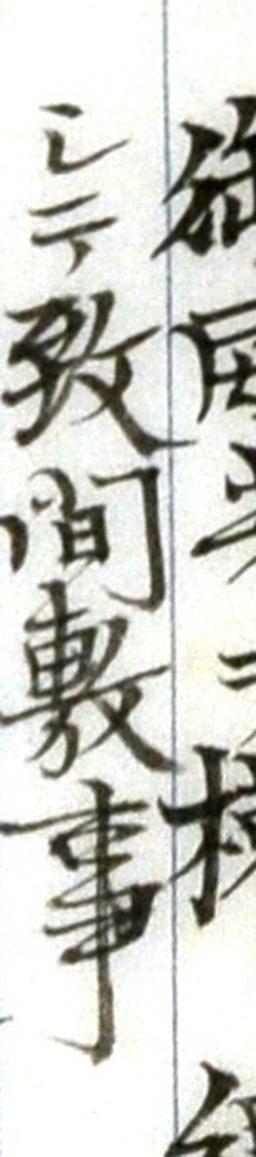して致間敷事
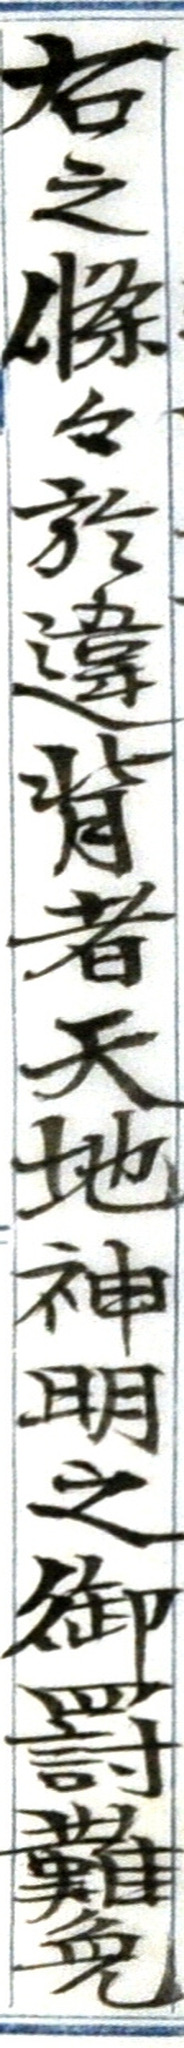右之條々於違背者天地神明之御罰難免

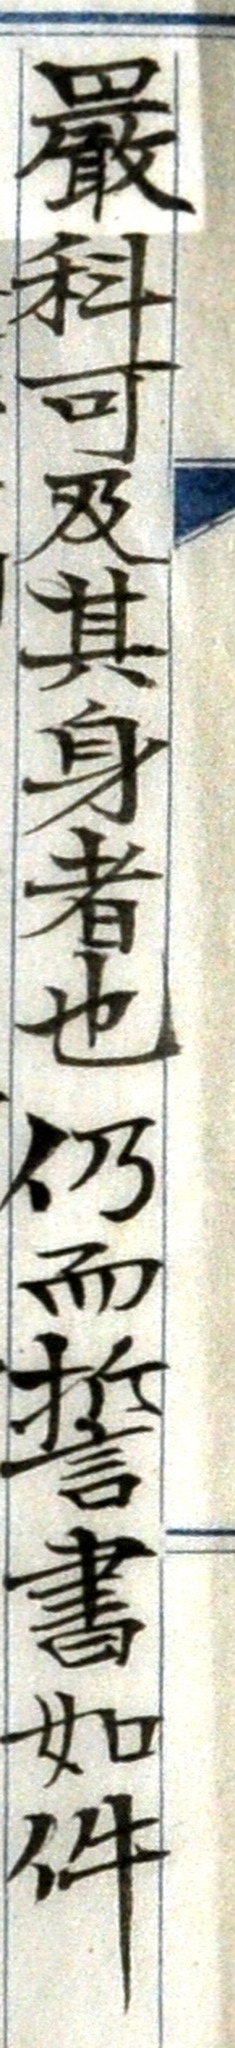嚴科可及其身者也仍而誓書如件
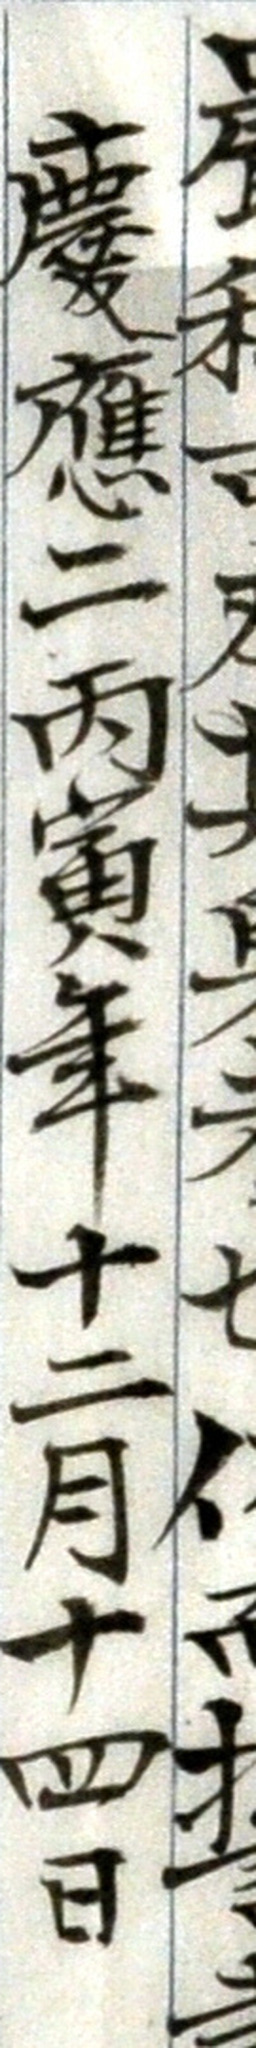慶応二丙寅年十二月十四日
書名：高遠藩兵員名簿歩兵銃隊・郷村募集員
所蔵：伊那市立高遠町図書館・合同会社AMANE
